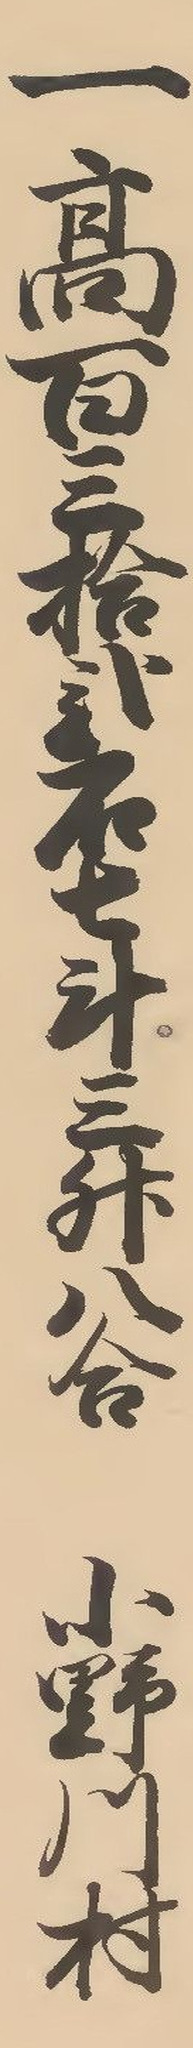一高百三拾弐石七斗三升八合小野川村
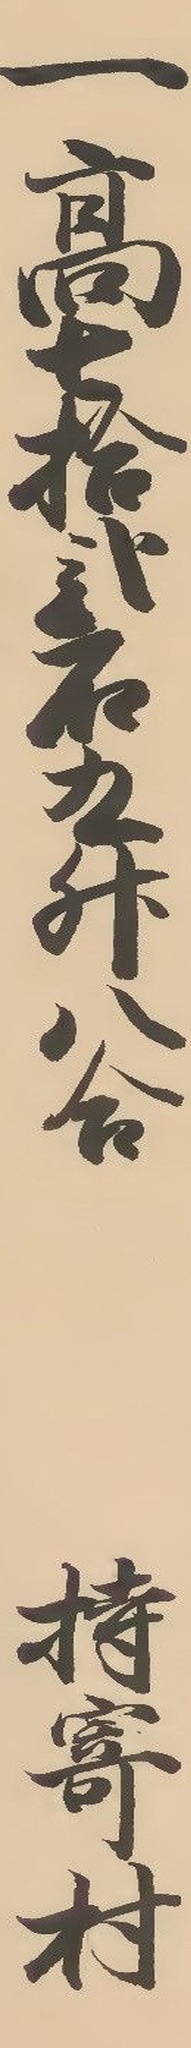一高七拾弐石九升八合持寄村
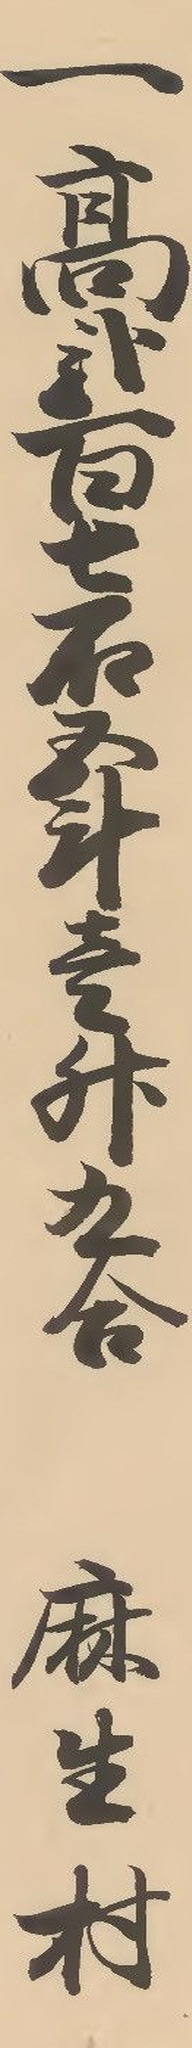一高弐百七石五斗壱升九合麻生村
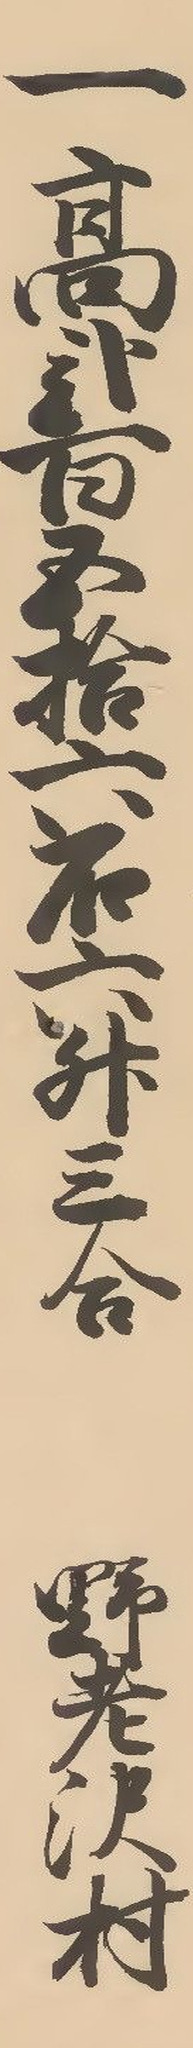一高弐百五拾六石六升三合野老沢村
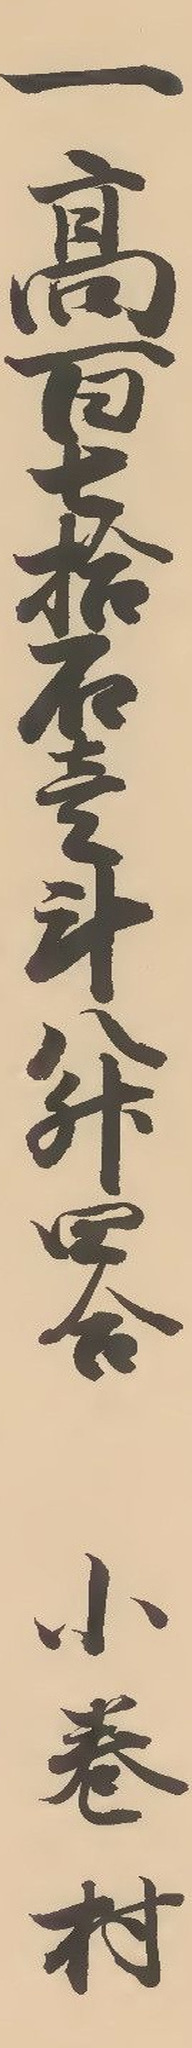一高百七拾石壱斗八升四合小巻村
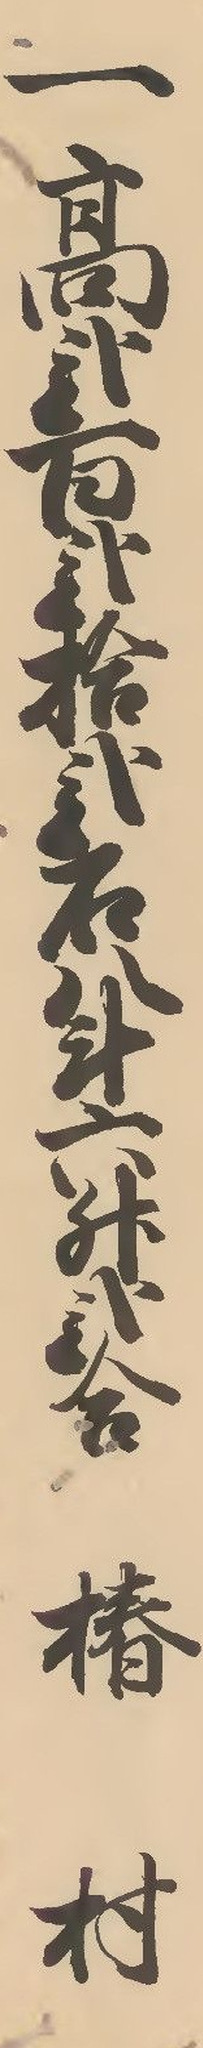一高弐百弐拾弐石八斗六升弐合椿村

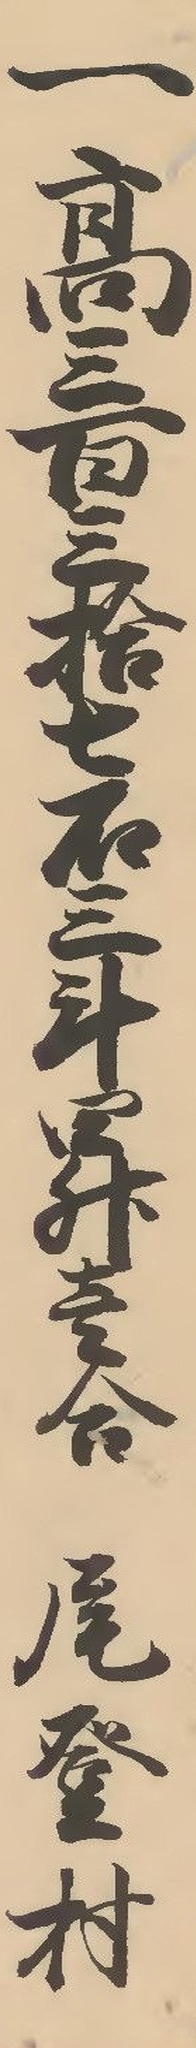一高三百三拾七石三斗四升壱合尾登村
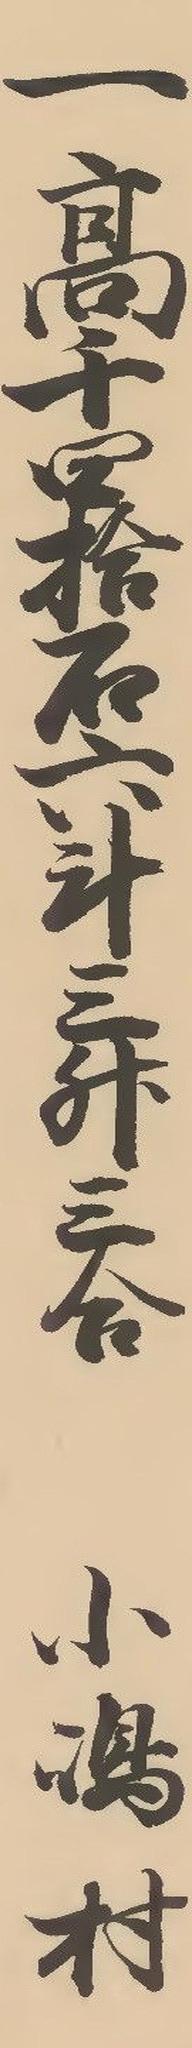一高千四拾石六斗三升三合小島村
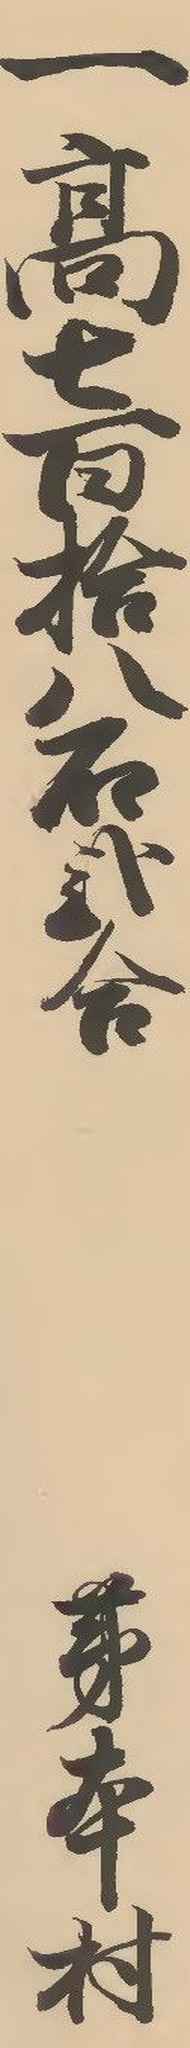一高七百拾八石弐合茅本村
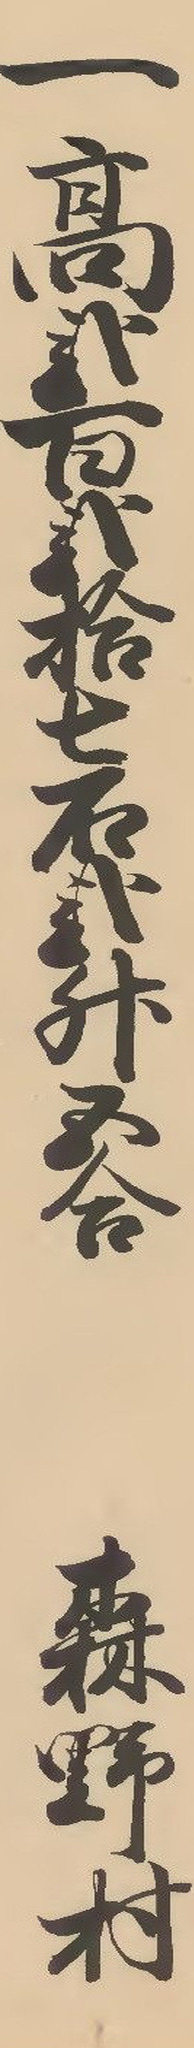一高弐百弐拾七石弐升五合森野村
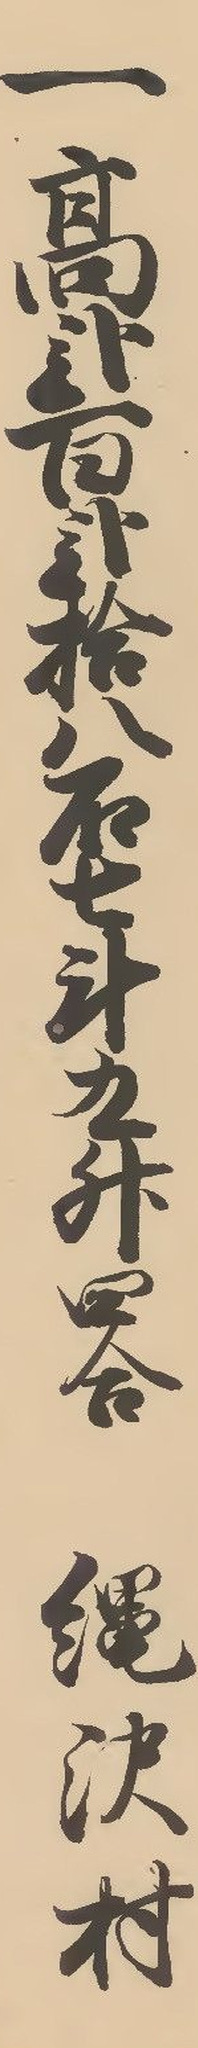一高弐百弐拾八石七斗九升四合縄沢村
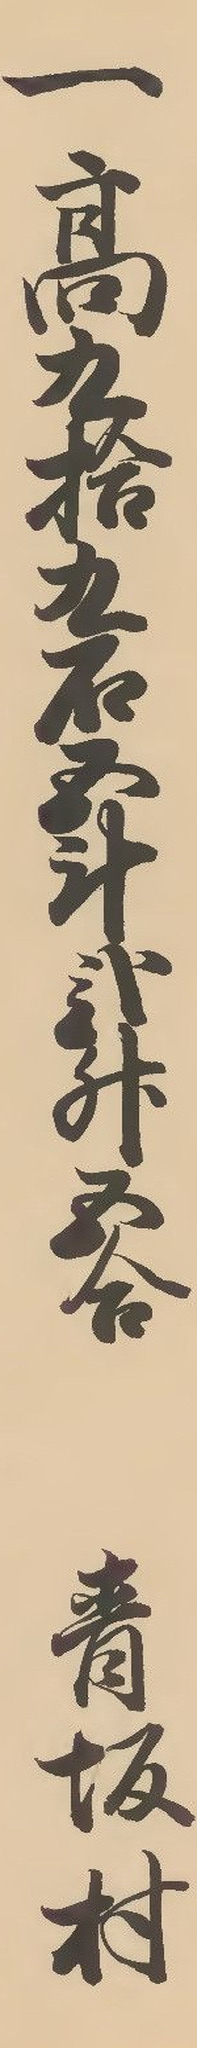一高九拾九石五斗弐升五合青坂村
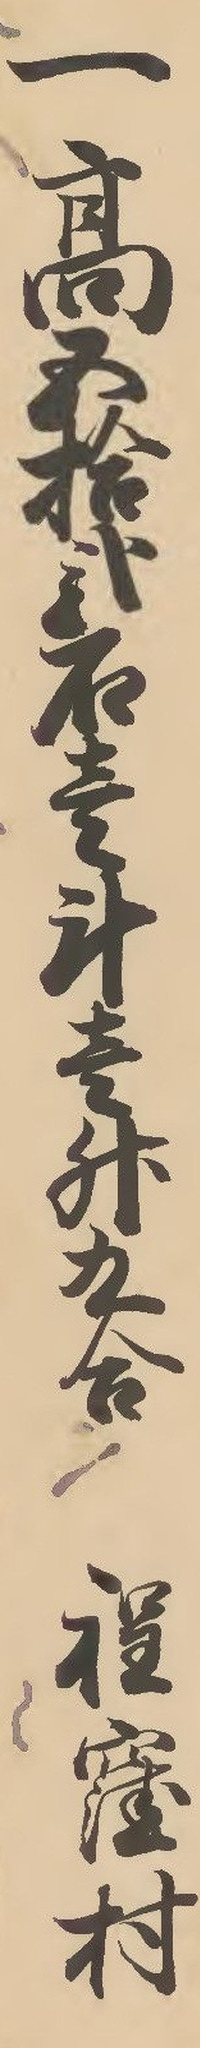一高五拾弐石壱斗壱升九合程窪村

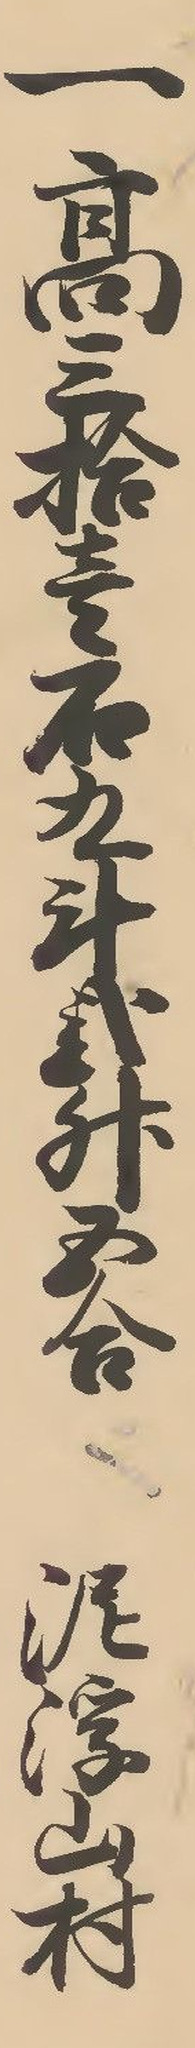一高三拾壱石九斗弐升五合泥浮山村
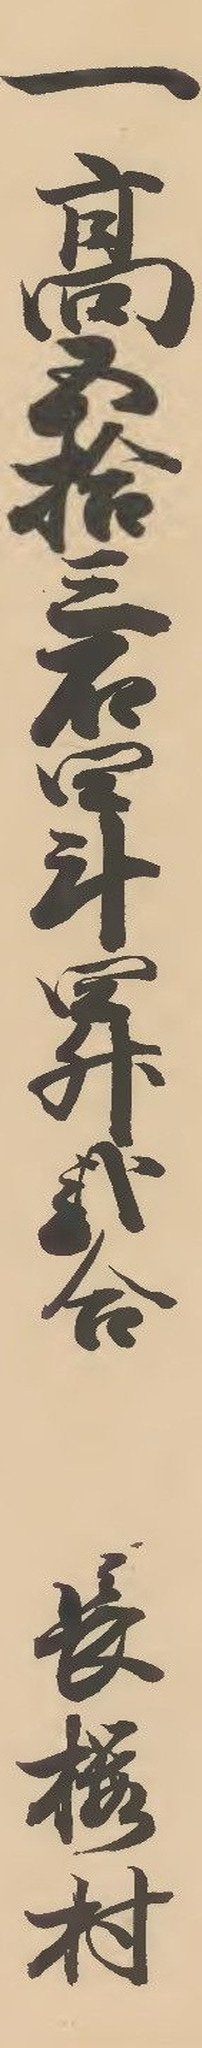一高五拾三石四斗四升弐合長桜村
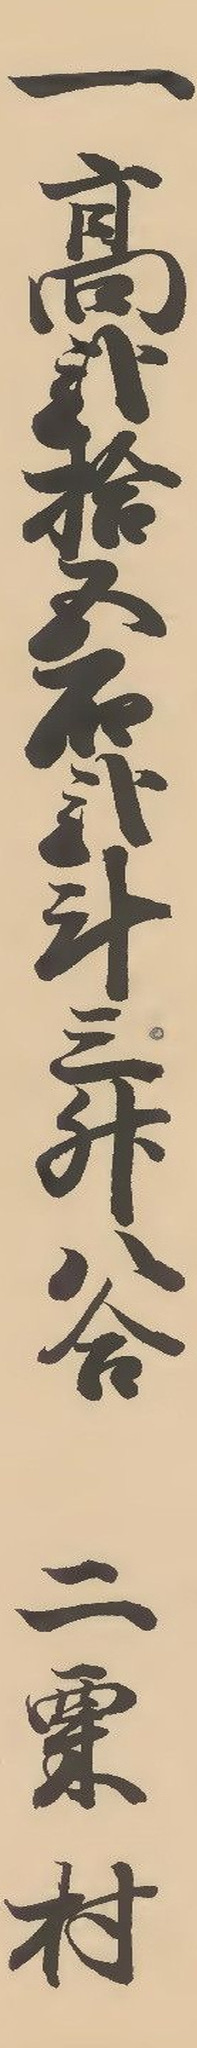一高弐拾五石弐斗三升八合二栗村
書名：陸奥国郷帳　１
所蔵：国立公文書館 National Archives of Japan
